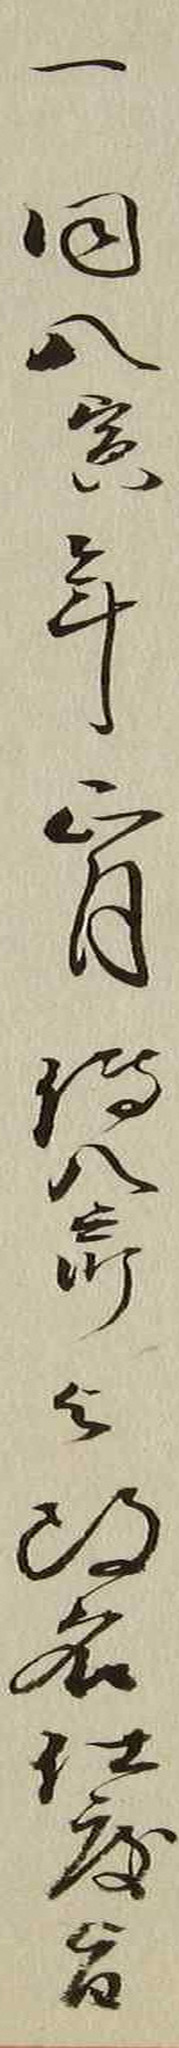一同八寅年正月伝八郎与改名仕度旨
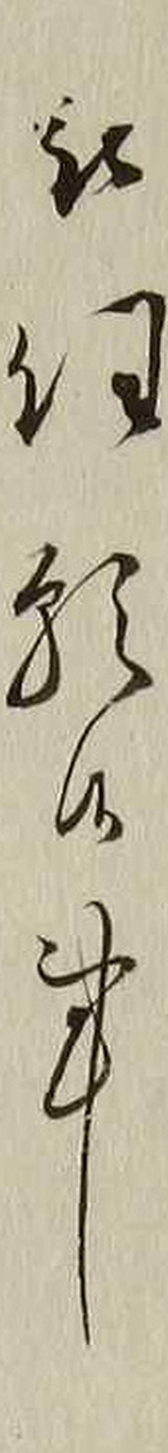被任願候事
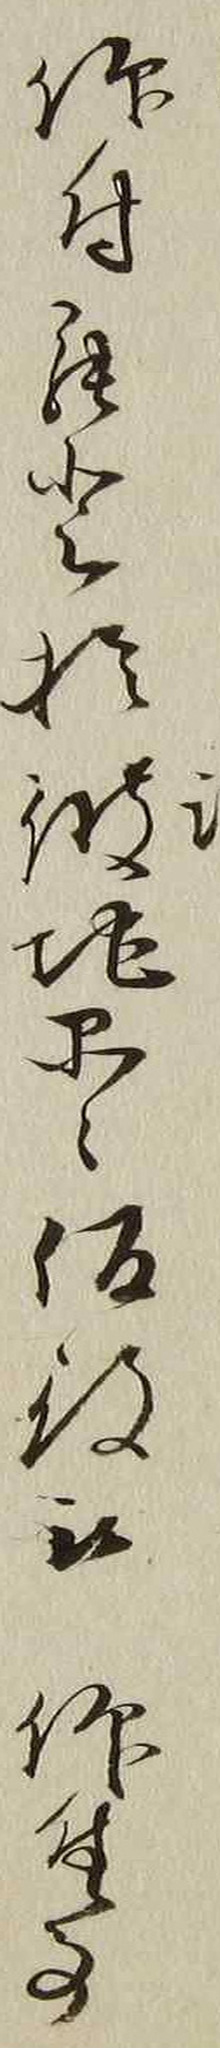仰付罷登於彼地品々仮役被仰付候事
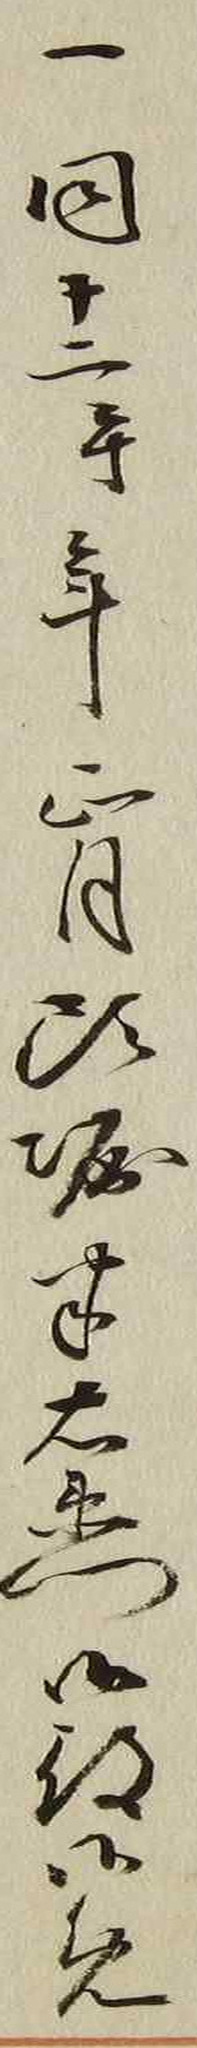一同十二午年正月頭堀半右衛門御役御免
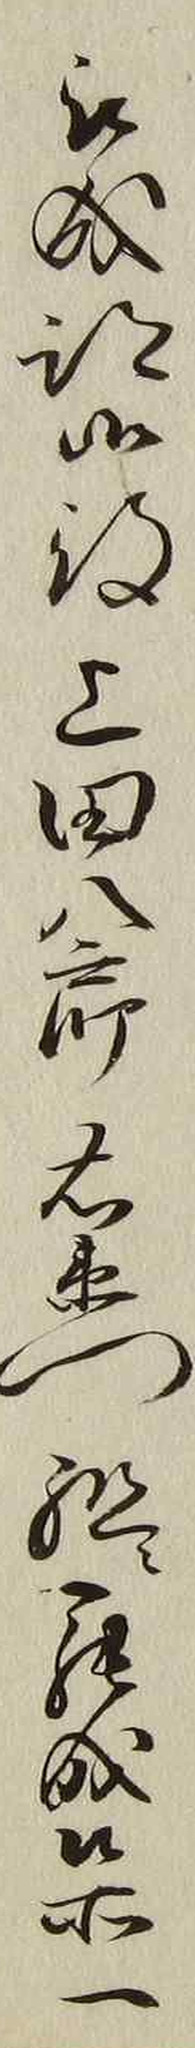被成跡御役上田八郎右衛門組ニ罷成候所一
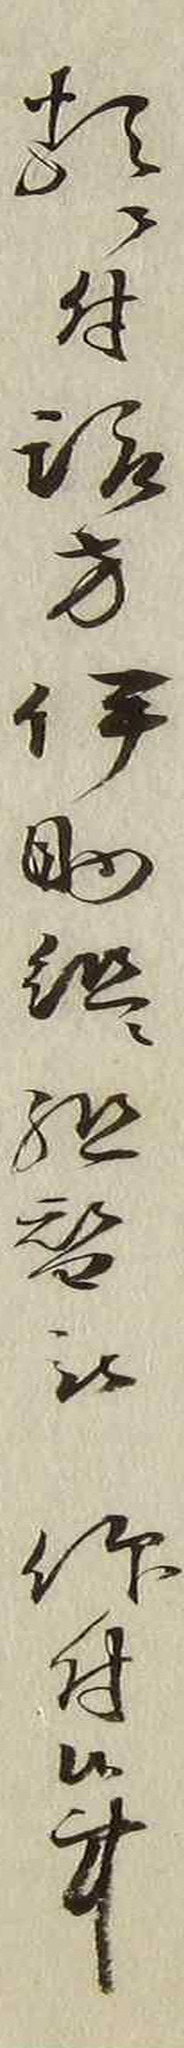類ニ付諏方伊助組ニ組替被仰付候事
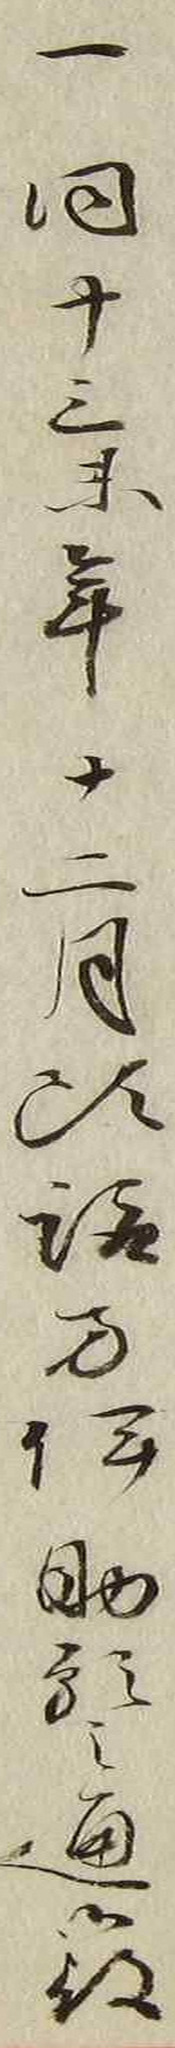一同十三未年十二月頭諏方伊助願之通御役
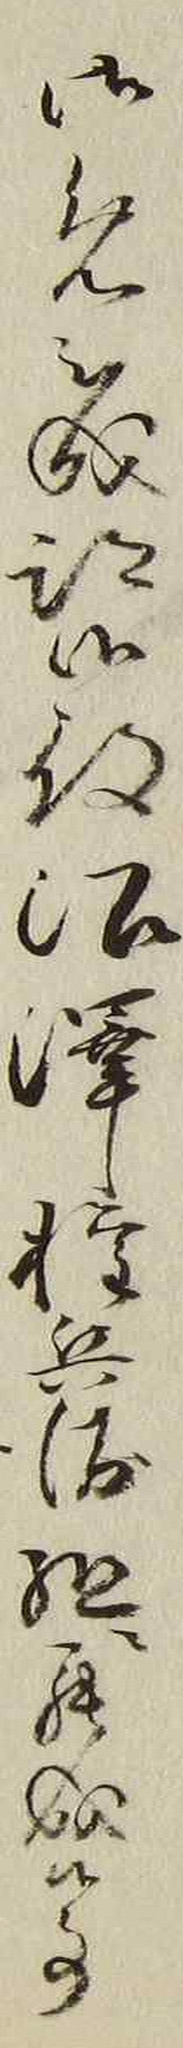御免被成跡御役沼沢権兵衛組ニ罷成候事
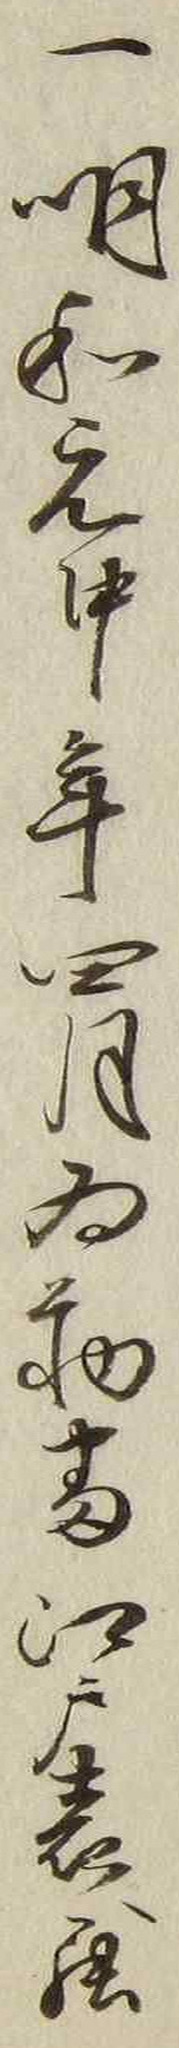一明和元申年四月為勤番江戸表へ罷
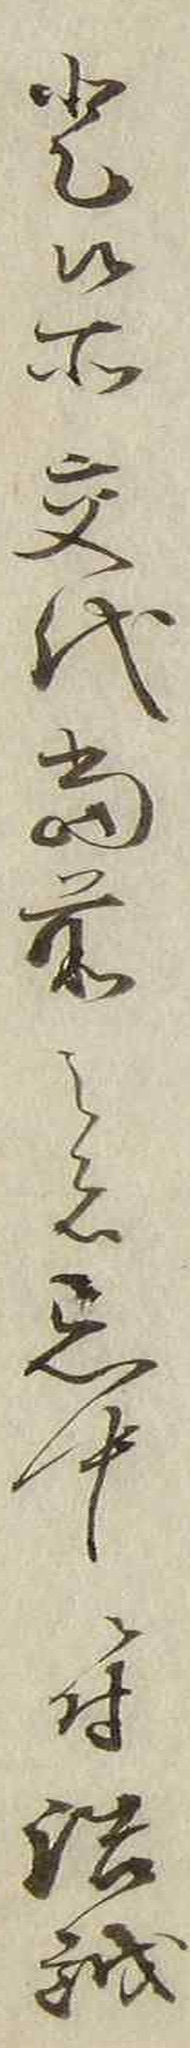登候所交代当前之者忌中ニ付詰越

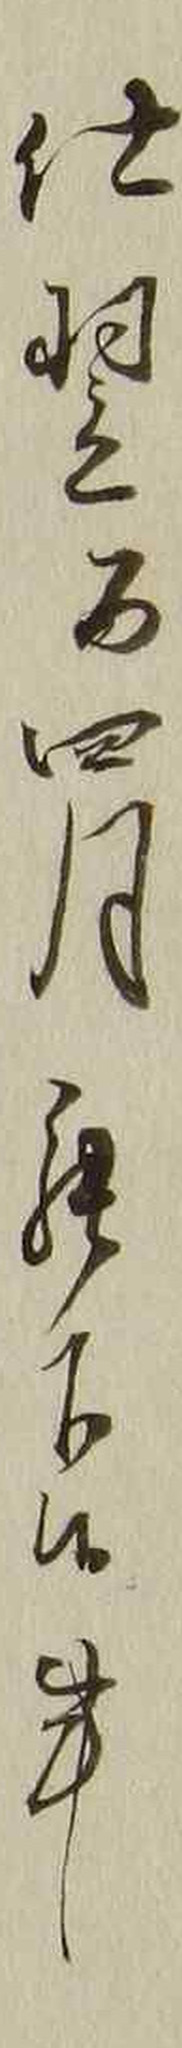仕翌酉四月罷下候事
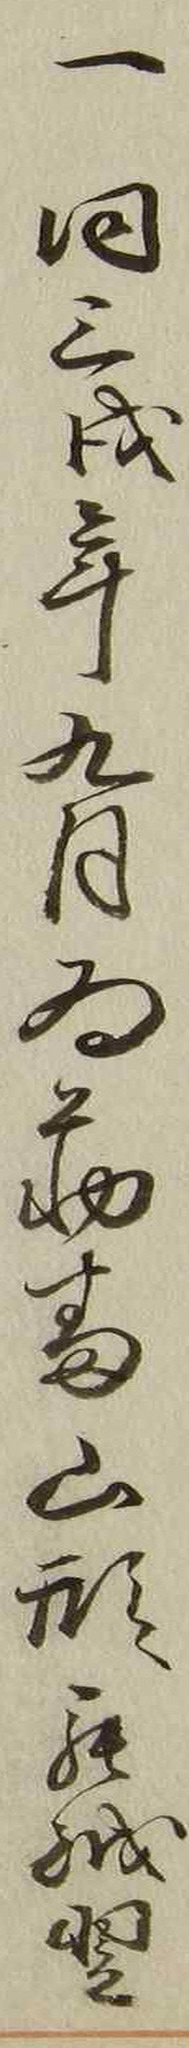一同三戌年九月為勤番山形へ罷越翌
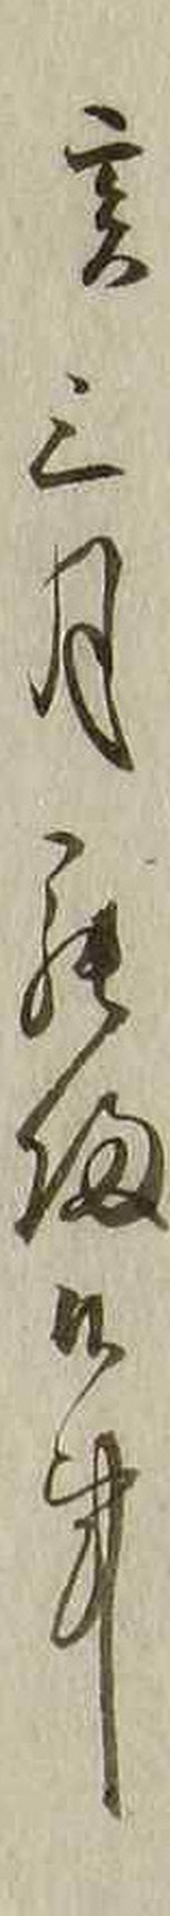亥三月罷帰候事
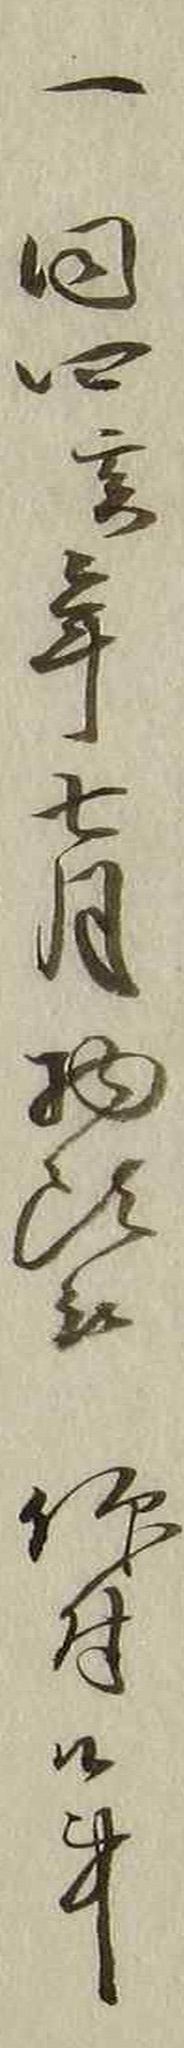一同四亥年七月物頭被仰付候事
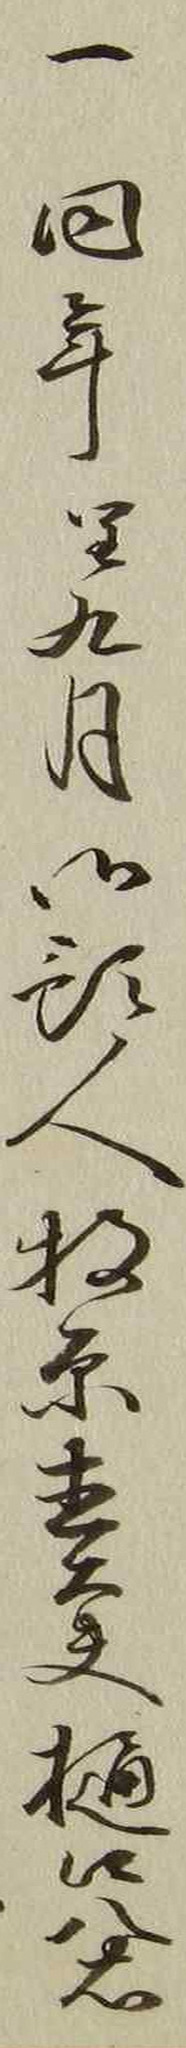一同年閏九月御預人枚原直大夫樋口八右
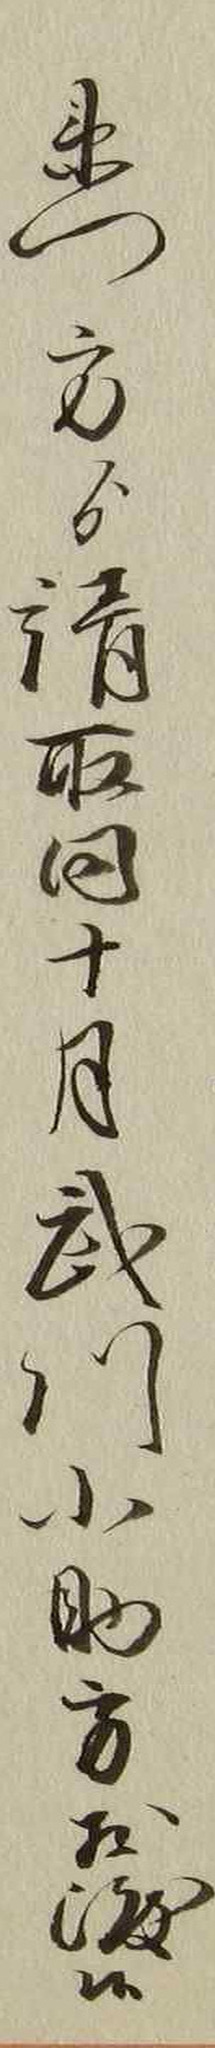衛門方ゟ請取同十月武川小助方へ相渡候
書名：諸士系譜　巻之122　よ之部5
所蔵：会津若松市立会津図書館
